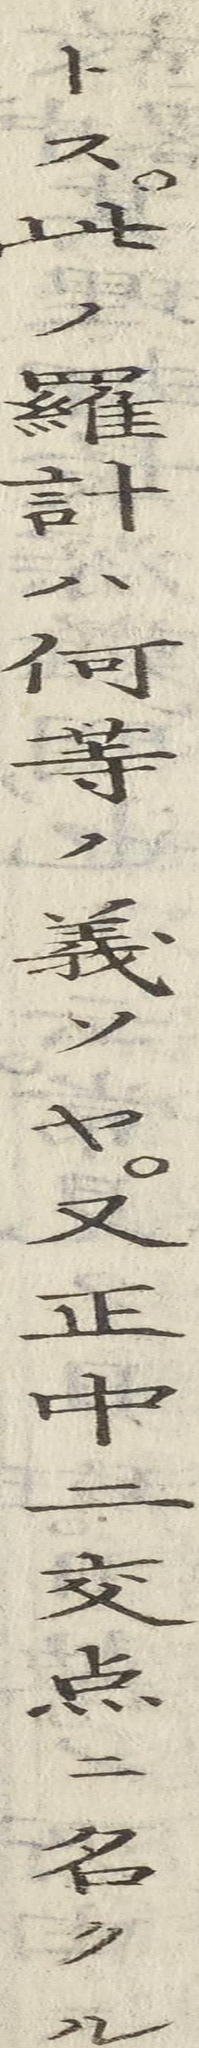トス。此ノ羅計ハ何等ノ義ソヤ。又正中ニ交点ニ名クル
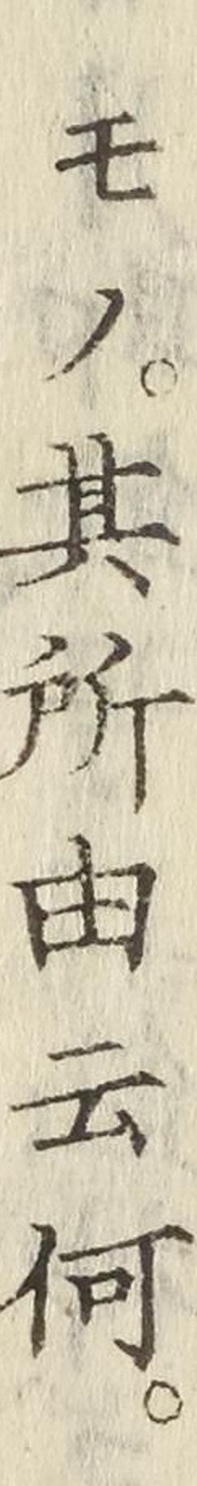モノ其所由云何。
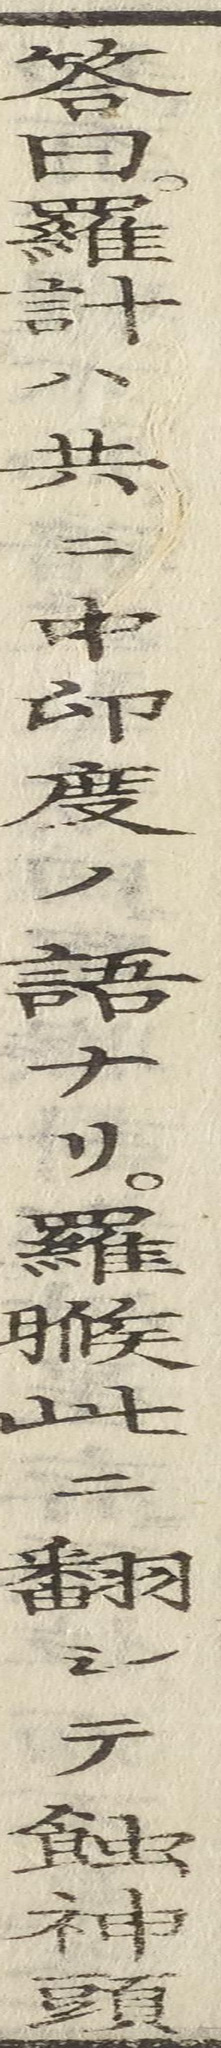答曰。羅計ハ共ニ中印度ノ語ナリ。羅睺此ニ翻シテ蝕神頭
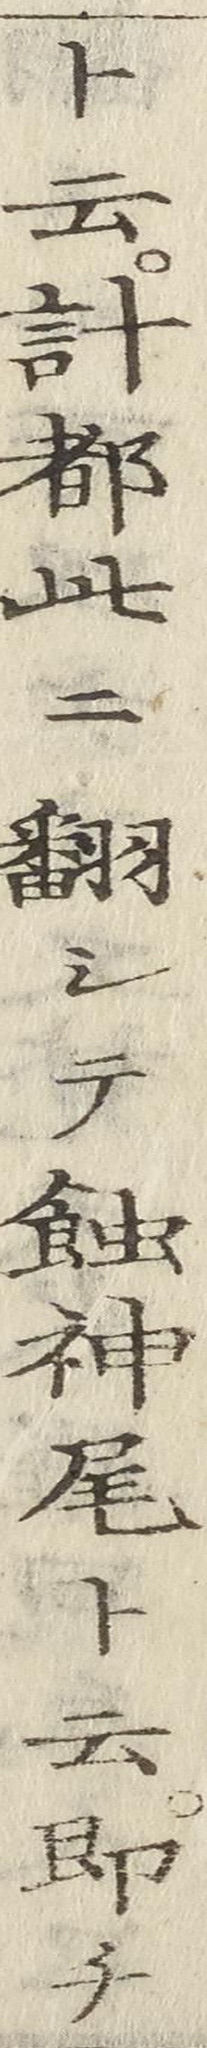ト云。計都此ニ翻シテ蝕神尾ト云。即チ
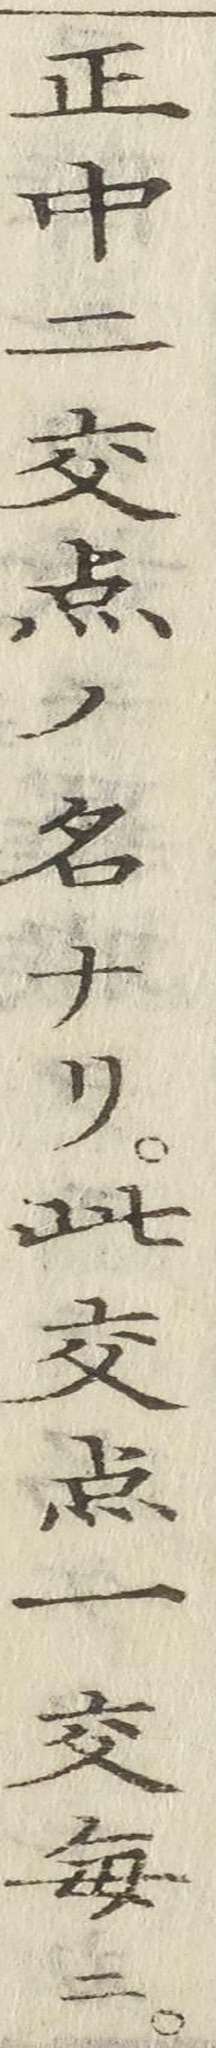正中ニ交点ノ名ナリ。此交点一交毎ニ。
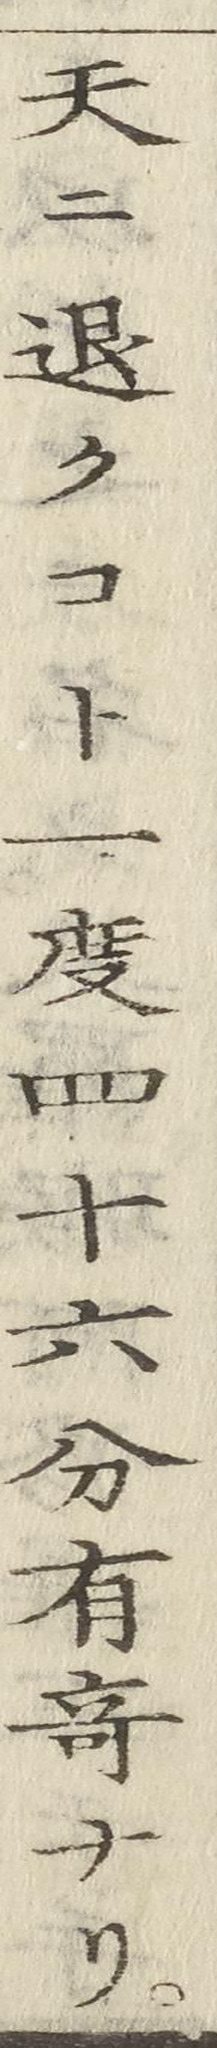天ニ退クコト一度四十六分有竒ナリ。
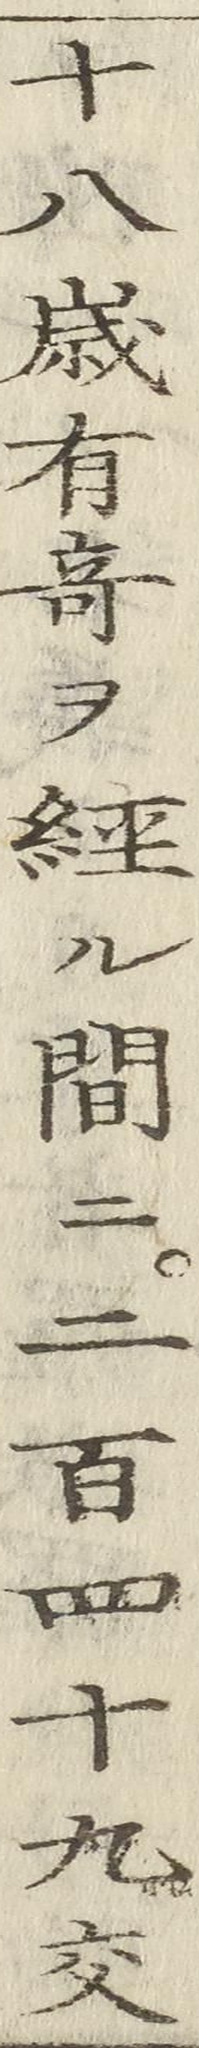十八歳有竒ヲ経間ニ。二百四十九交
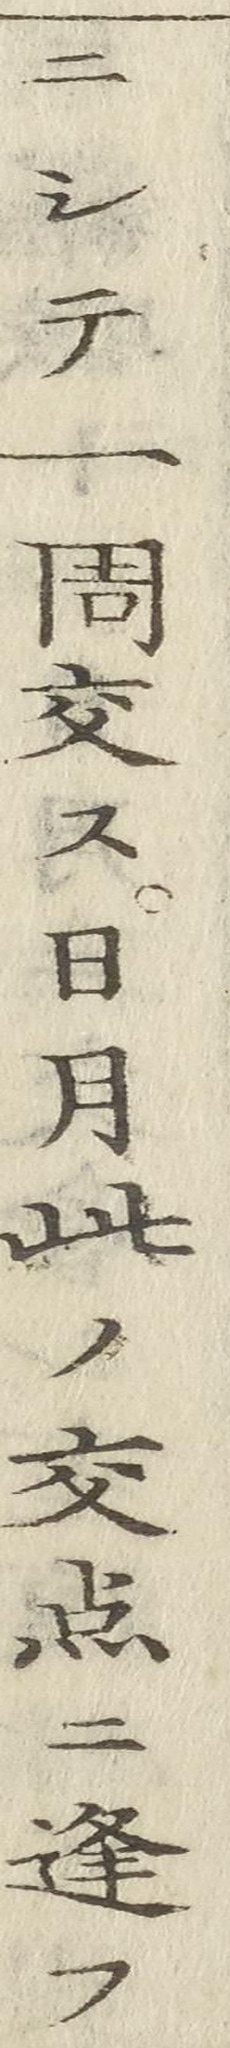ニシテ一周交ス。日月此ノ交点ニ逢フ
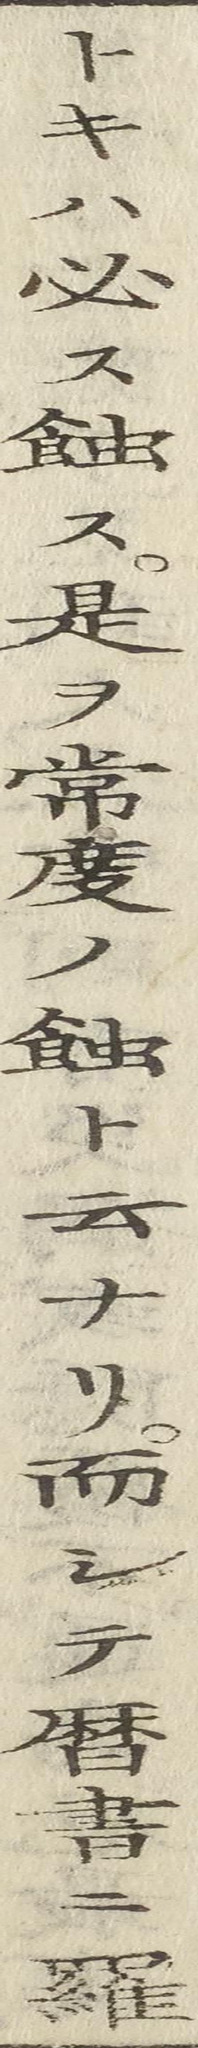トキハ必ス蝕ス。是ヲ常度ノ蝕ト云ナリ。而シテ暦書ニ羅
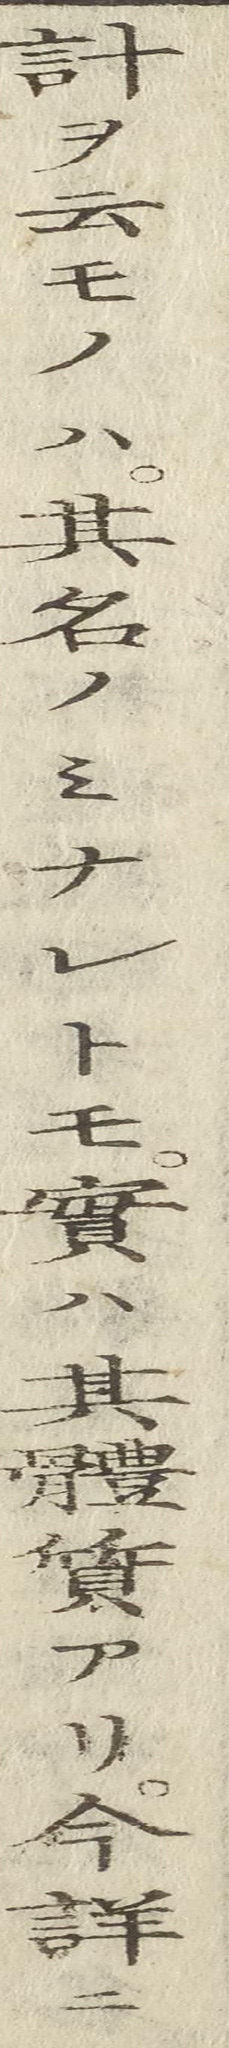計ヲ云モノハ。其名ノミナレトモ。実ハ其体質アリ。今詳ニ

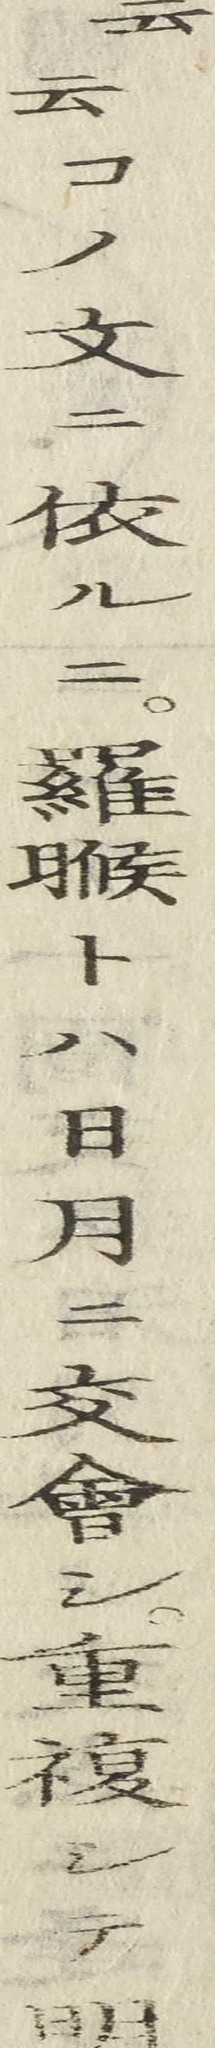云云コノ文ニ依ルニ。羅睺トハ日月ニ交会シ。重複シテ明
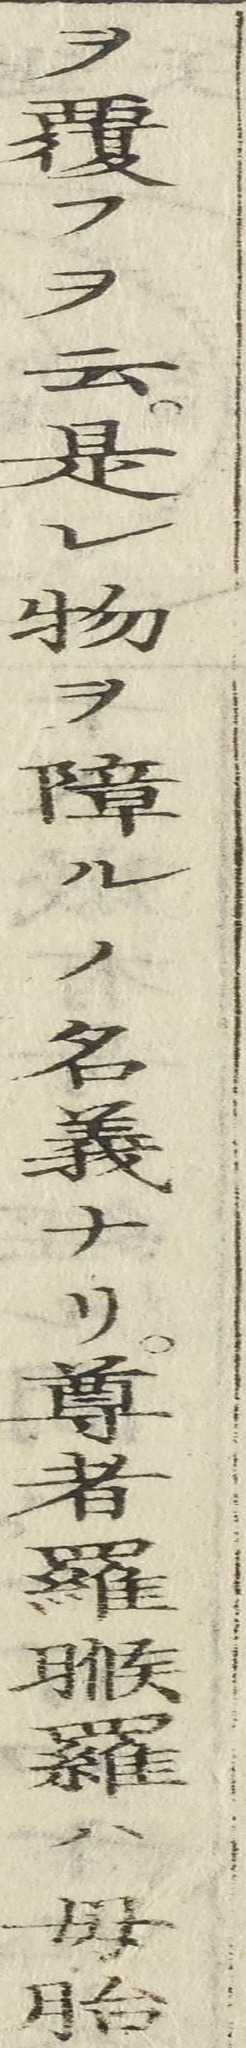ヲ覆フヲ云。是レ物ヲ障ルノ名義ナリ。尊者羅睺羅ハ母胎
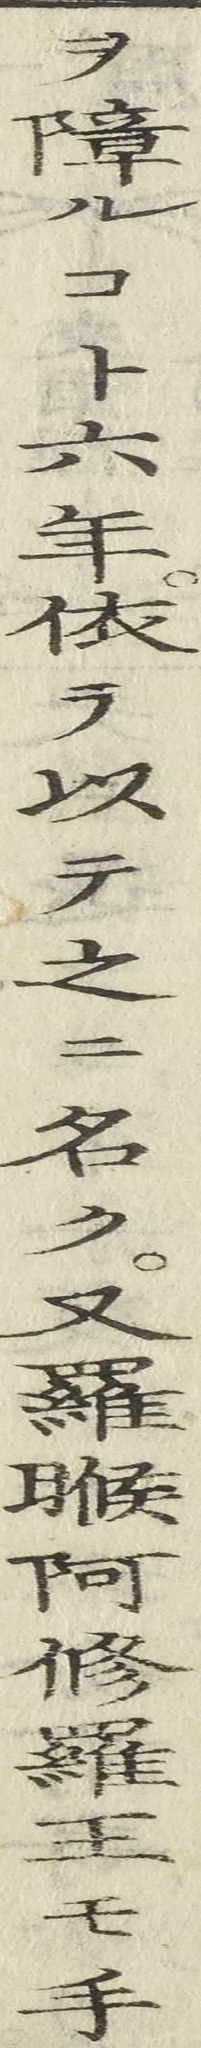ヲ障ルコト六年。依ヲ以テ之ニ名ク。又羅睺阿修羅王モ手
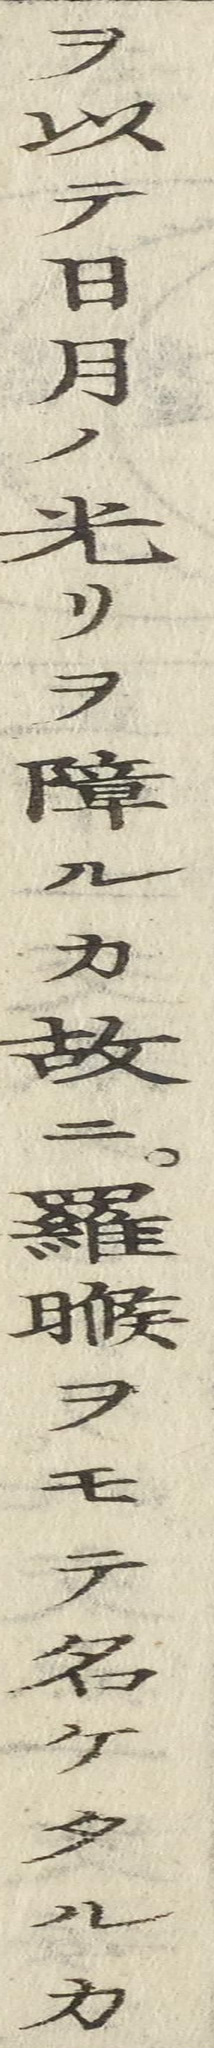ヲ以テ日月ノ光リヲ障ルカ故ニ。羅睺ヲモテ名ケタルカ
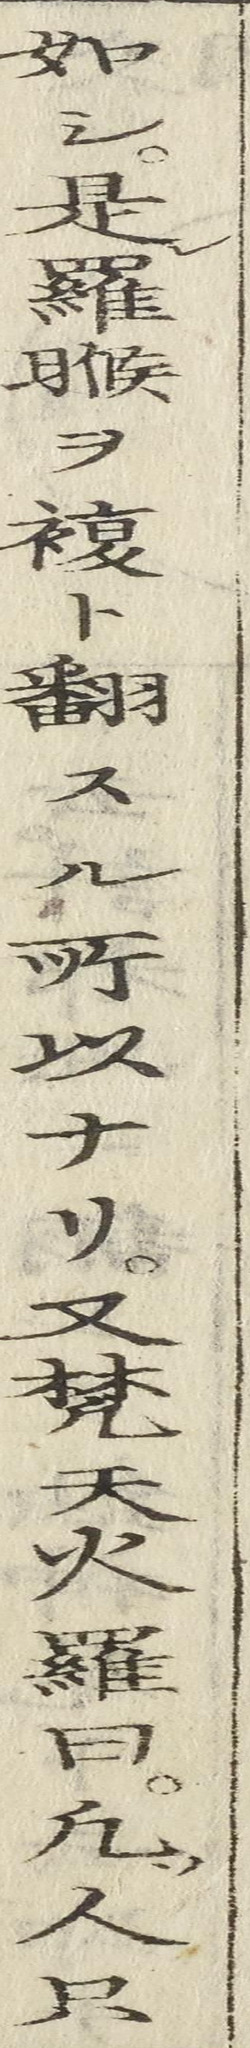如シ。是羅睺ヲ複ト翻スル所以ナリ。又梵天火羅曰。凡人只
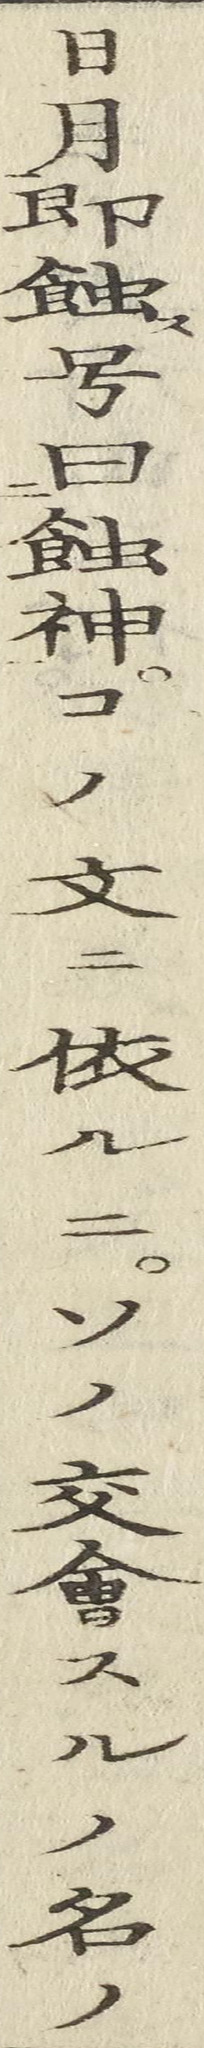日月即蝕号曰ニ蝕神。コノ文ニ依ルニ。ソノ交会スルノ名ノ
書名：護法新論　二編　下
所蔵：東京大学地震研究所図書室 Earthquake Research Institute Library, The University of Tokyo, JAPAN
